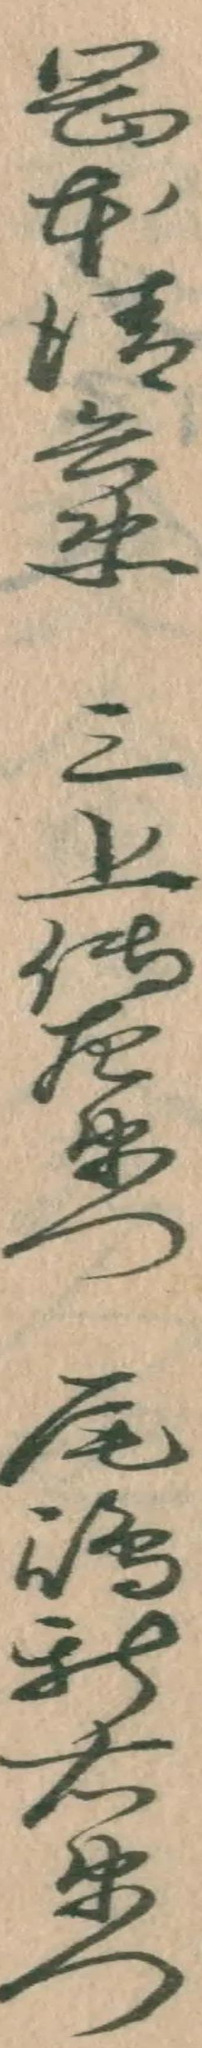岡本清兵衛三上伝左衛門尾崎新右衛門
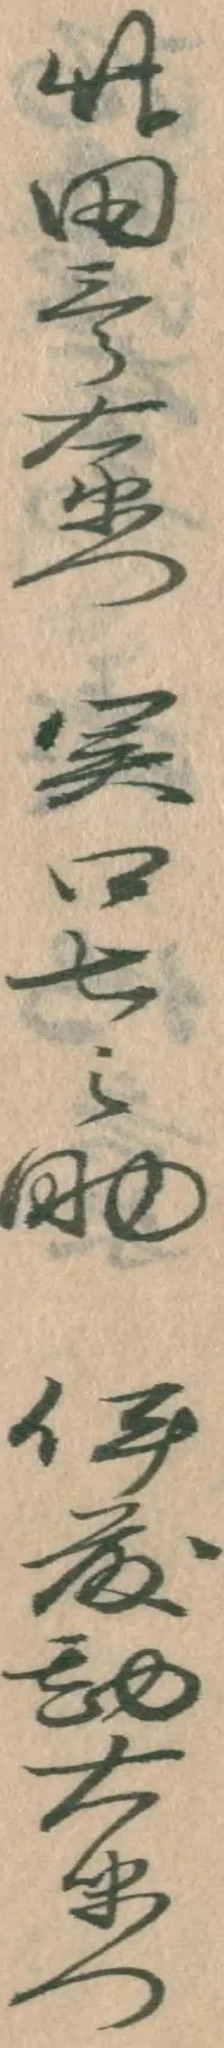竹田三郎右衛門関口七之助伊藤勘右衛門
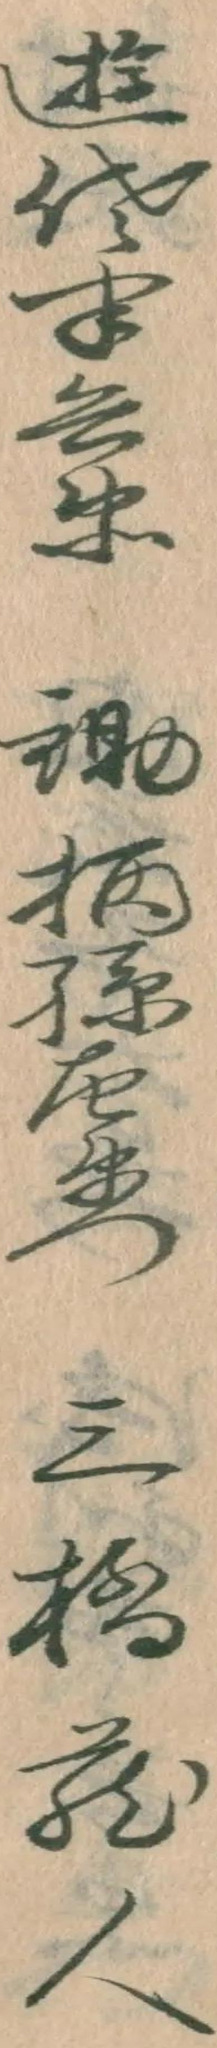遊佐半兵衛鋤柄孫左衛門三橋蔵人
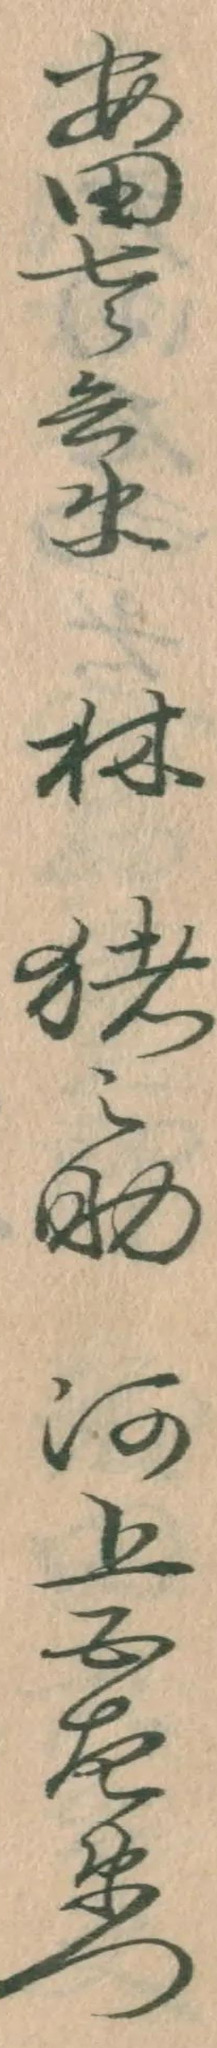安田七郎兵衛林猪之助河上五左衛門
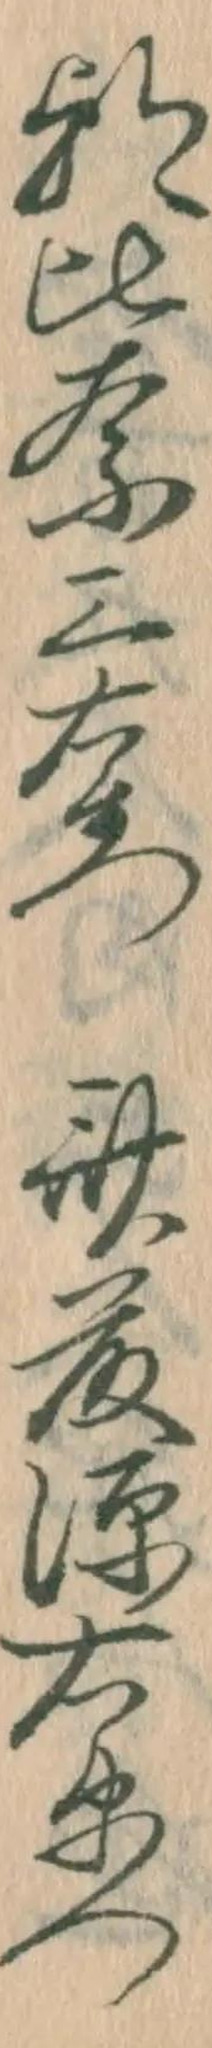朝比奈三右衛門斎藤源右衛門
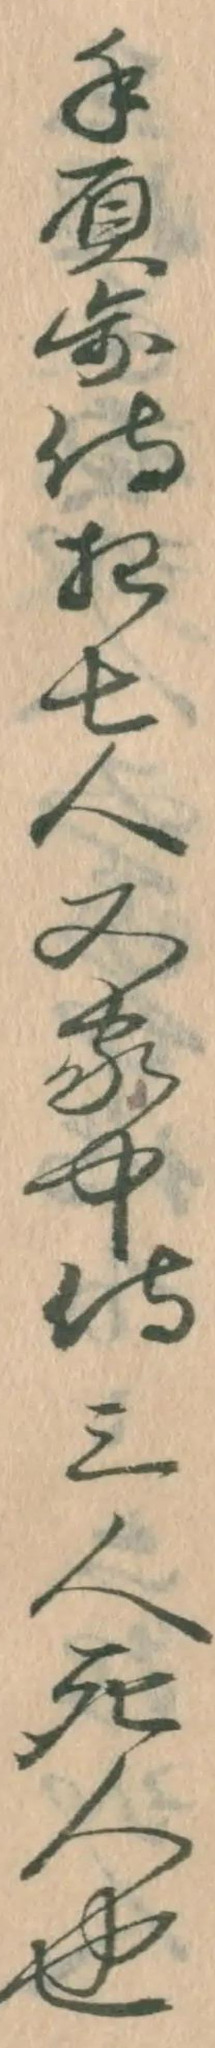手負歩侍拾七人又家中侍三人死人也

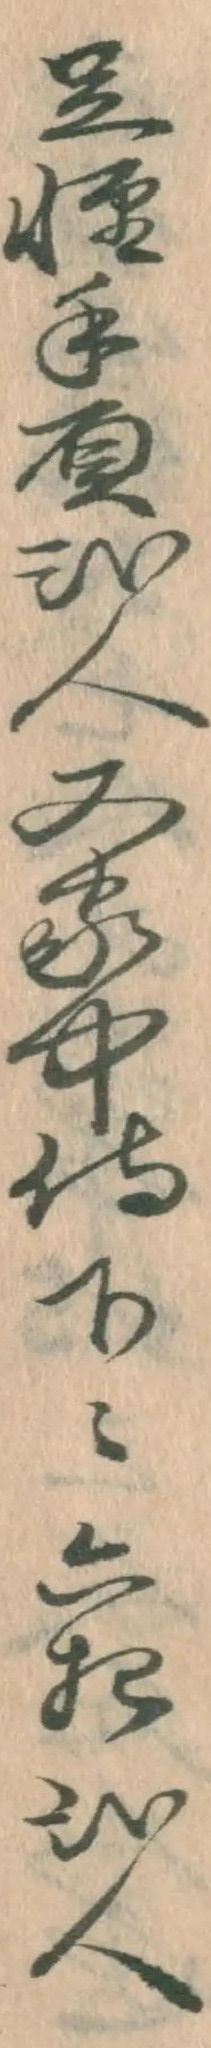足軽手負弐人又家中侍下々六拾弐人
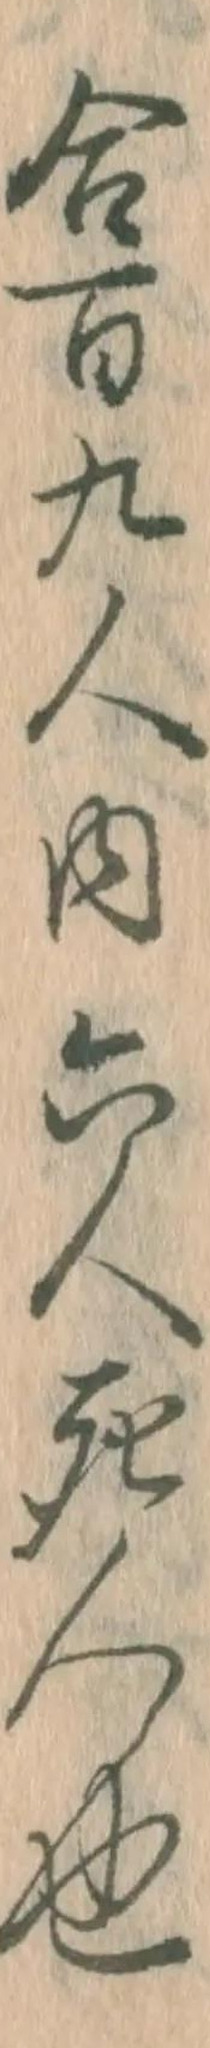合百九人内六人死人也
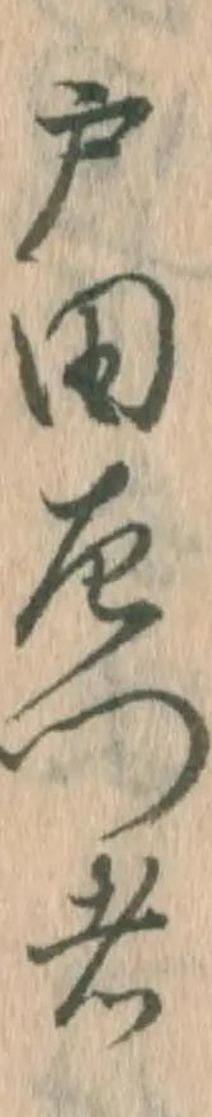戸田左門者
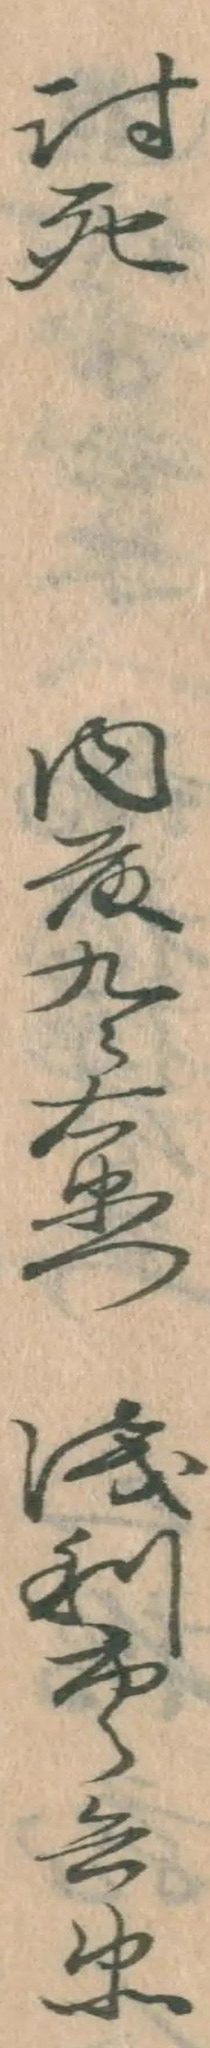討死内藤九郎右衛門浅利市郎兵衛
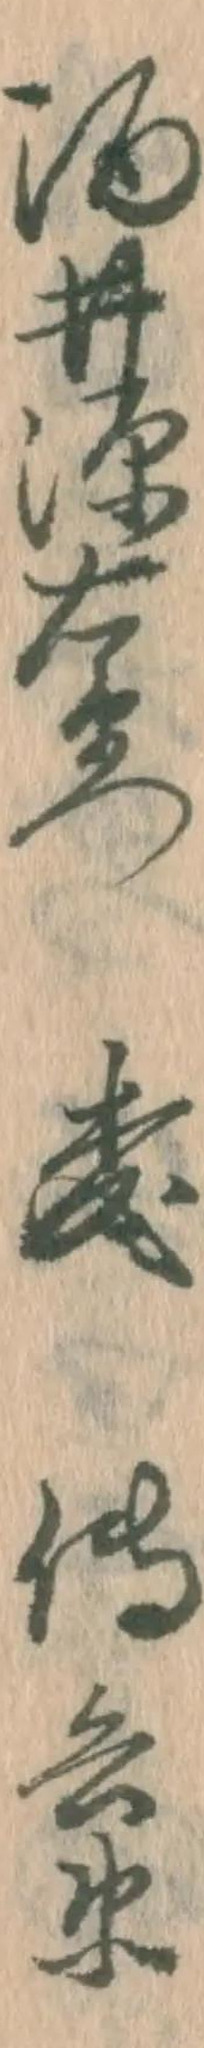酒井源左衛門森伝兵衛
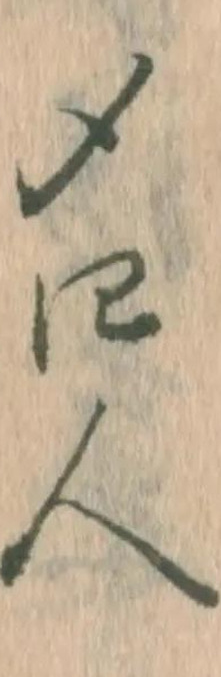〆四人
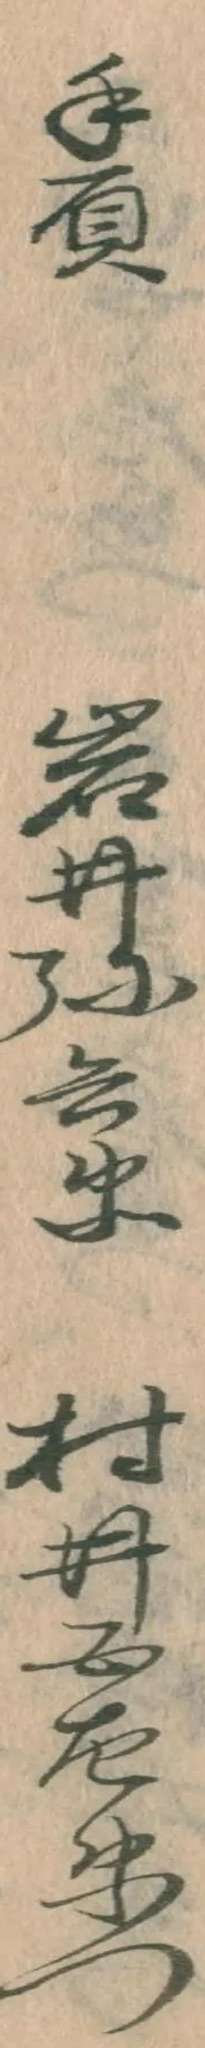手負岩井弥兵衛村井五左衛門
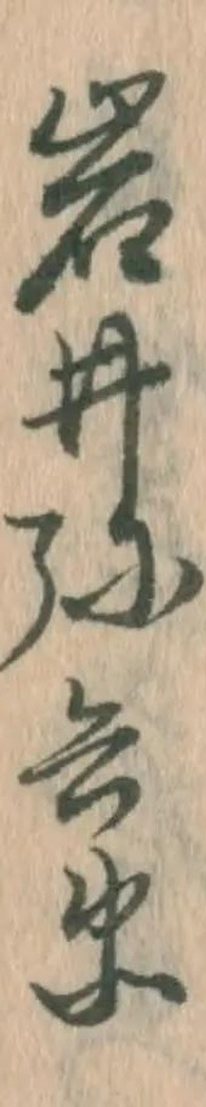桜井武兵衛
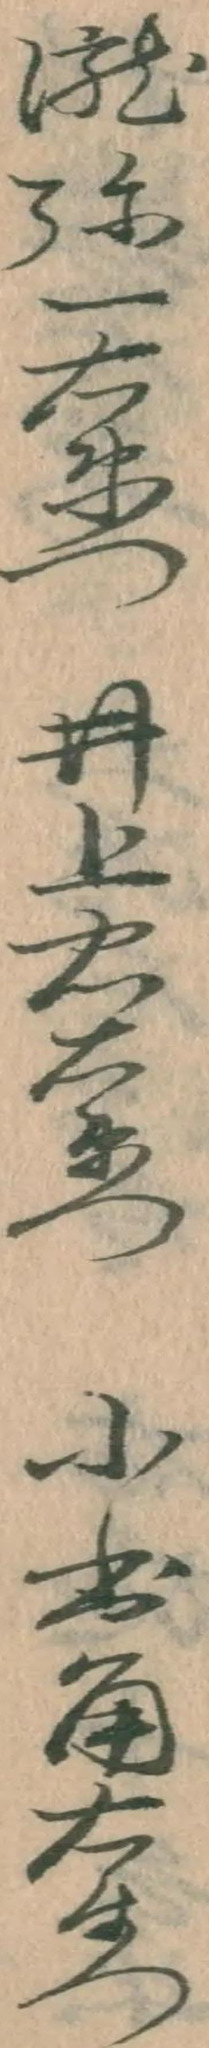瀧弥一右衛門井上忠右衛門小出角右衛門
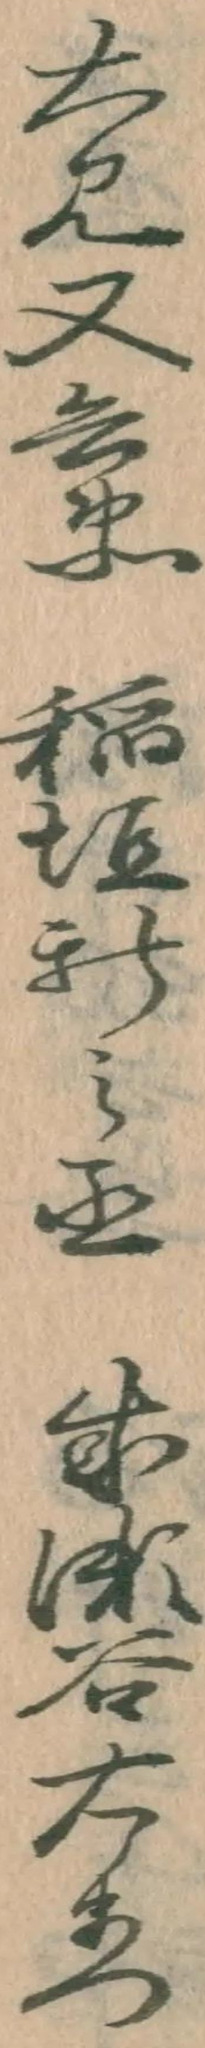大見又兵衛稲垣新之丞成瀬谷右衛門
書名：切支丹御退治記 49巻. [9]
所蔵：国立国会図書館 National Diet Library, JAPAN
